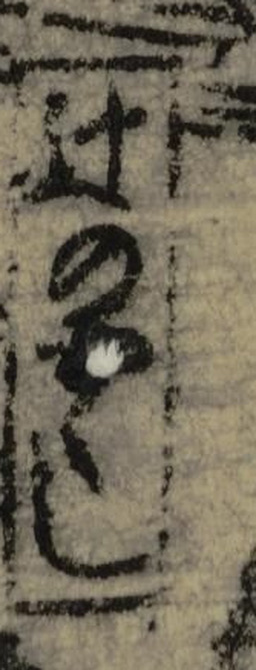辻のやくし
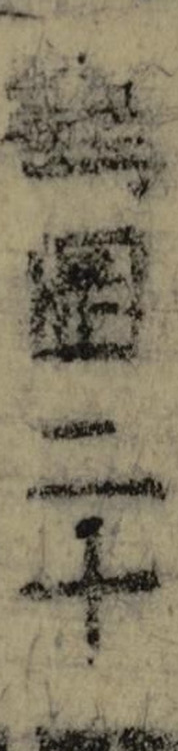鶴岡二十
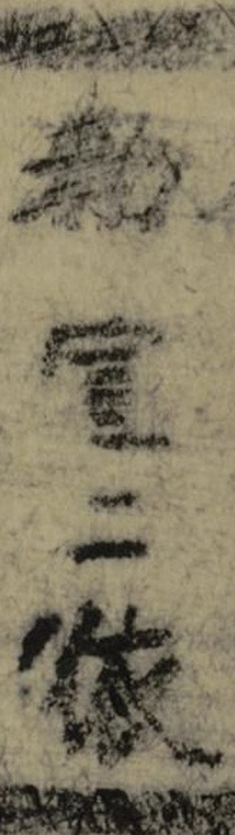勅宣ニ依
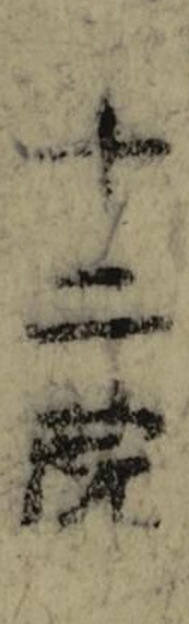十二院
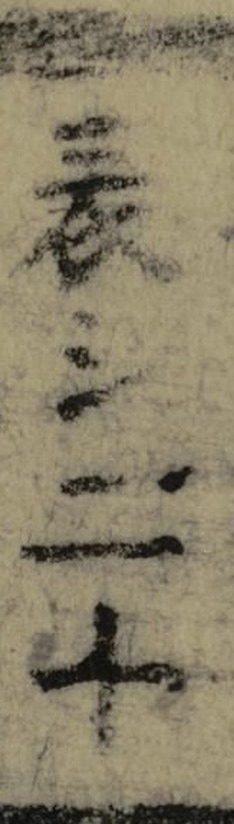表シ二十
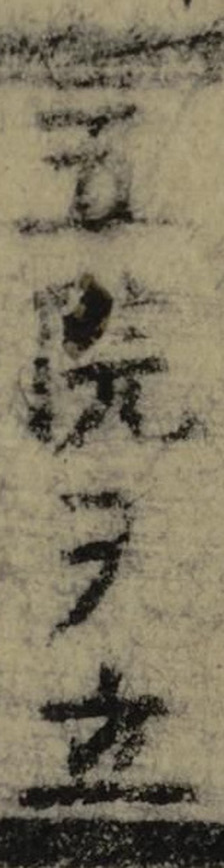五院ヲ立
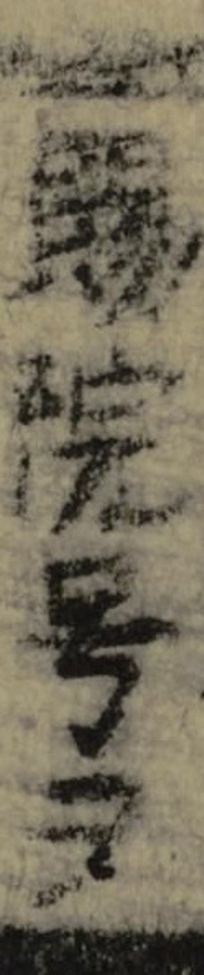賜院号ヲ
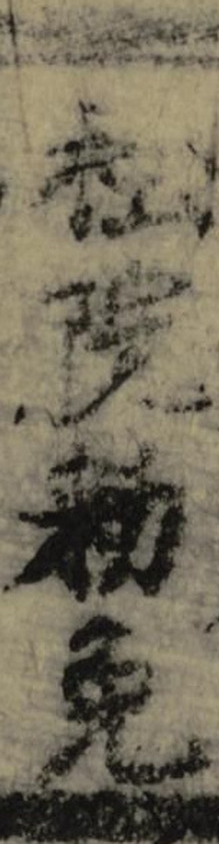松院勅免
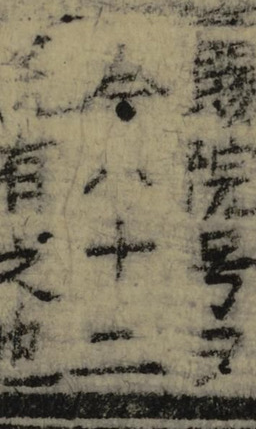今ハ十二
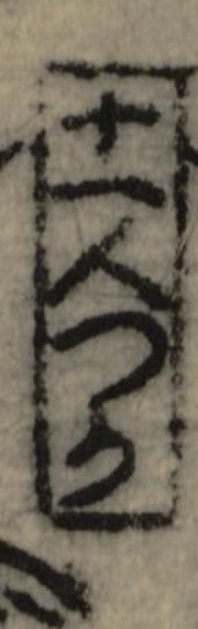十一人つか
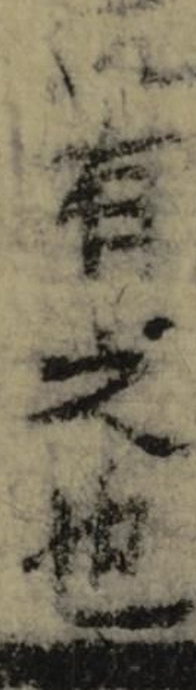院有之也
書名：鎌倉絵圖
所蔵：東京大学地震研究所図書室 Earthquake Research Institute Library, The University of Tokyo, JAPAN
